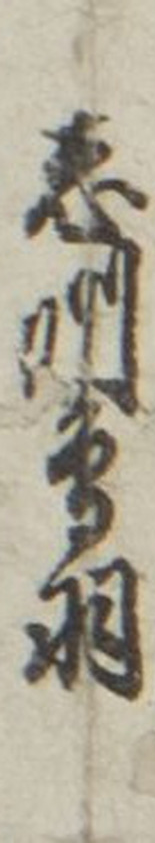志州鳥羽
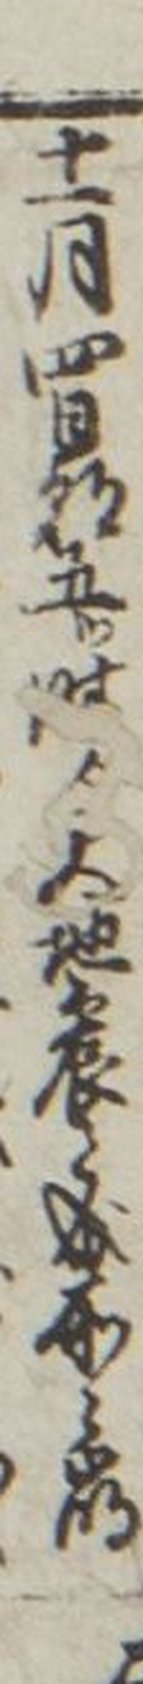十一月四日朝五つ時より大地震と成所々崩
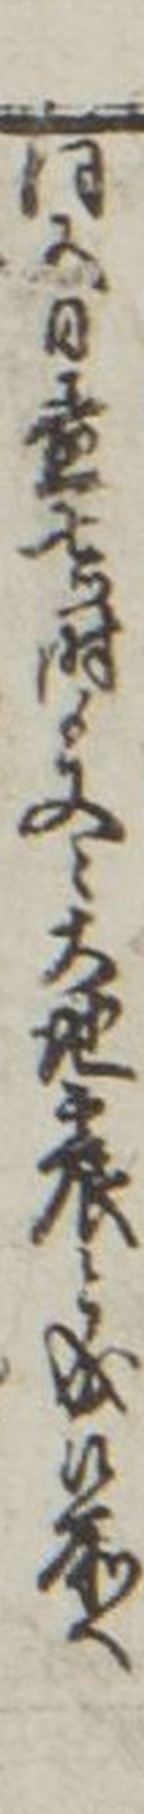同五日昼七つ時より又々大地震と成候所へ
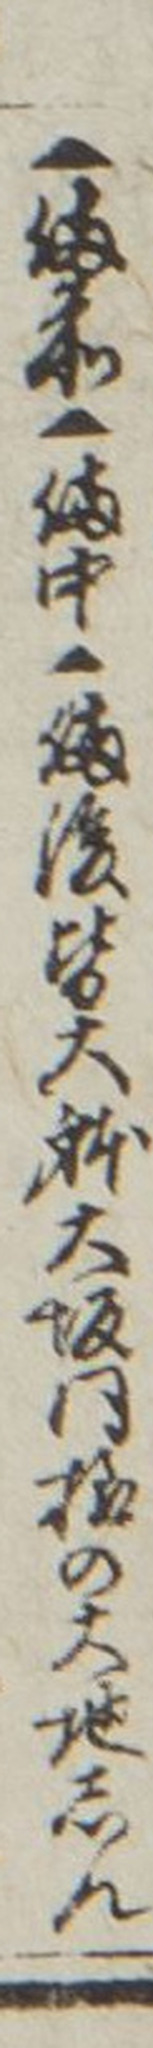▲備前▲備中▲備後皆大体大坂同様の大地しん
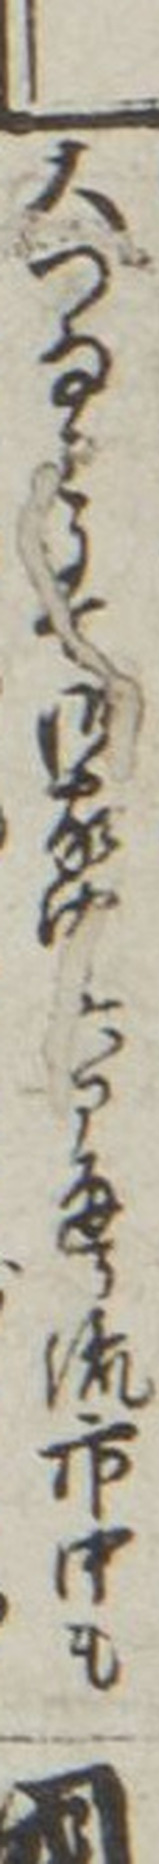大つなみにて御家六部通り流市中も
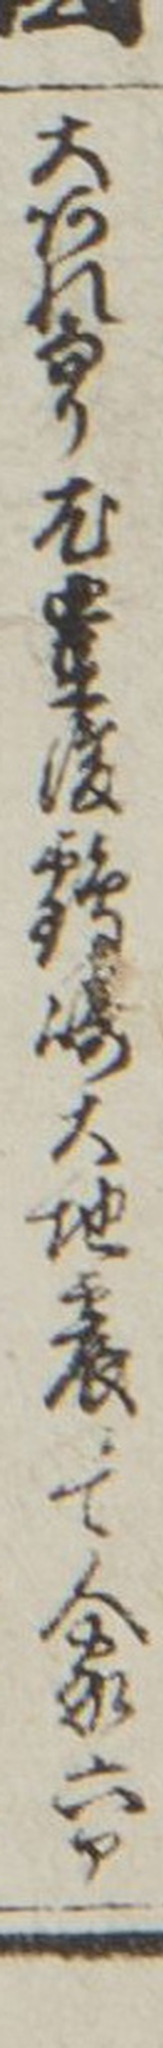大あれなり尤豊後鶴崎大地震にて人家六部
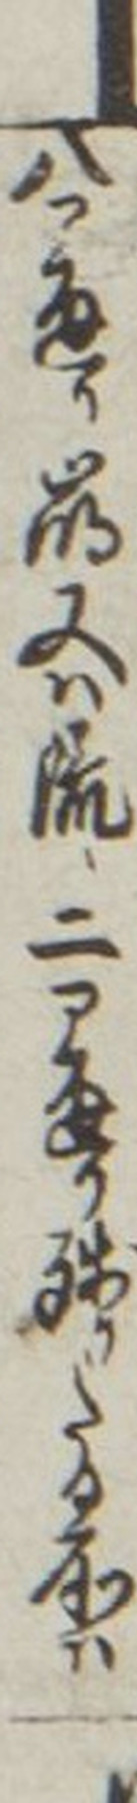八部通り崩又は流二部通り残りたる所は
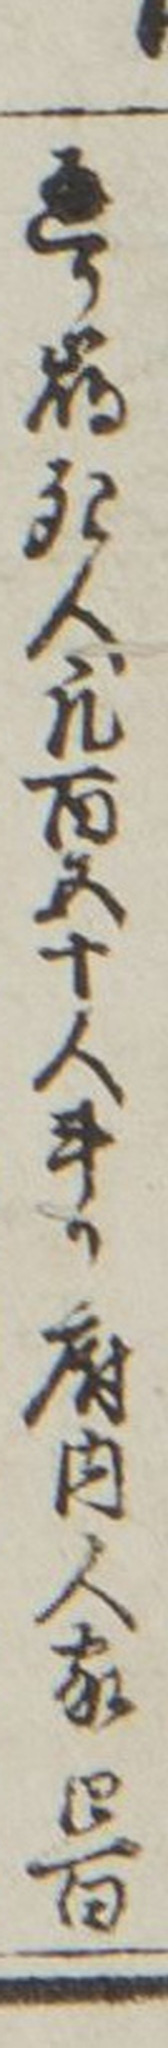通り崩死人凡百五十人計り府内人家四百
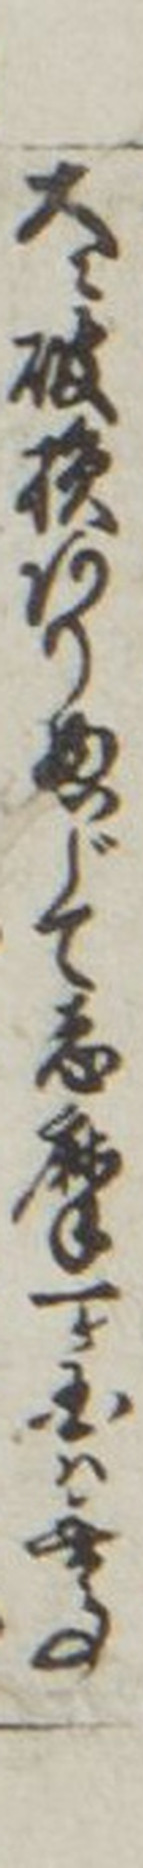大に破損あり惣じて志摩一ヶ国は無事
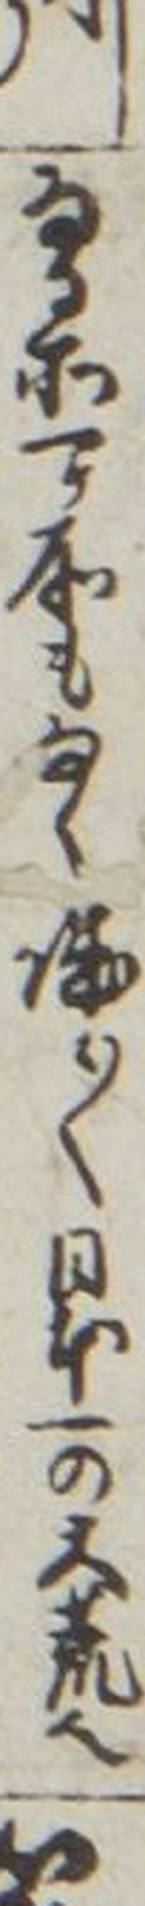なる所一ヶ所もなく誠に〳〵日本一の大荒也
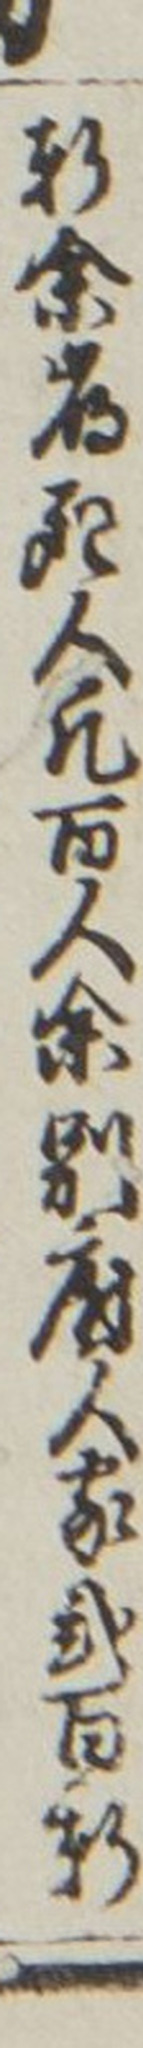軒余崩死人凡百人余別府人家弐百軒
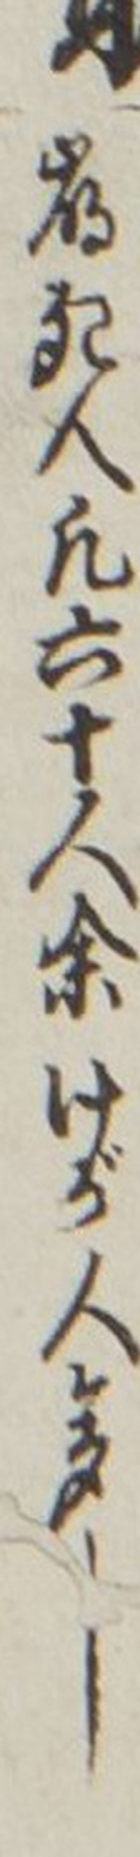崩死人凡六十人余けが人多し
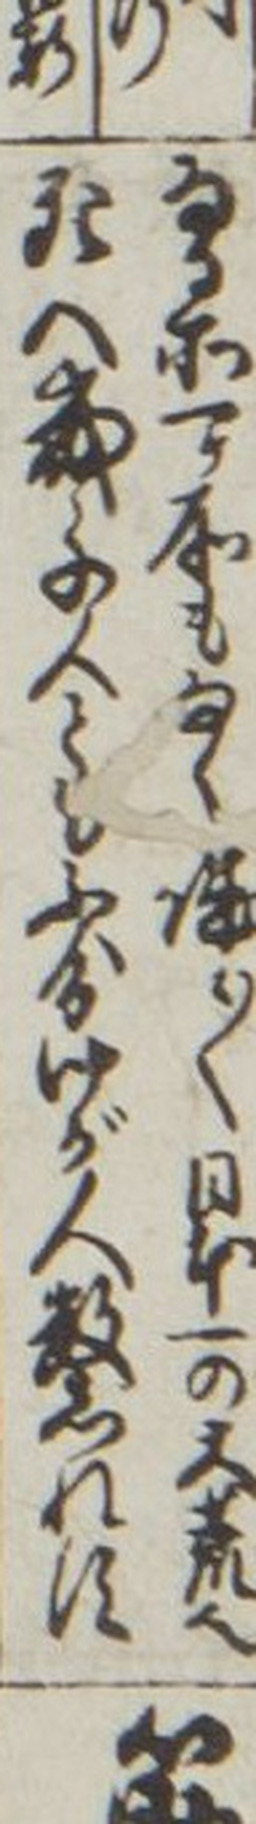死人幾千人とも不分けが人数しれす
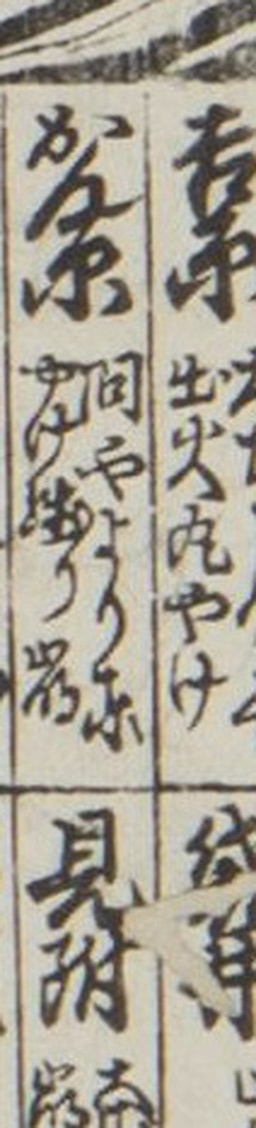かん原問やより東
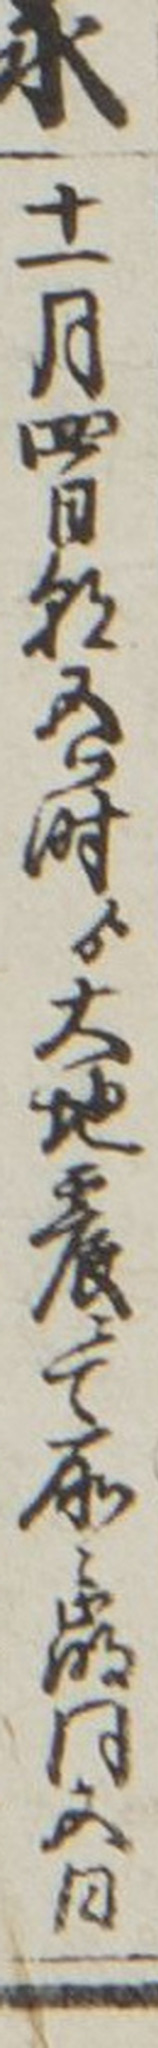十一月四日朝五つ時より大地震にて所々崩同五日
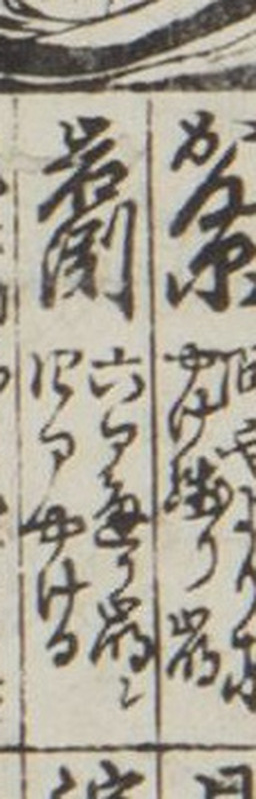岩淵六部通り崩れ
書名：嘉永七年寅十一月諸国大地震大津波并出火
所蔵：あいおいニッセイ同和損保株式会社
